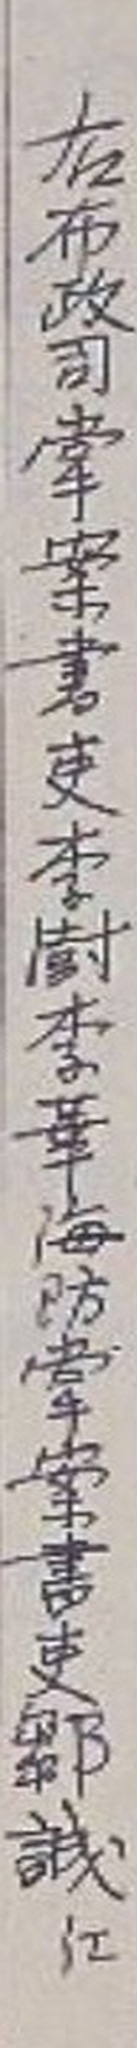右布政司掌案書吏李澍李華海防掌案書吏鄒誠え
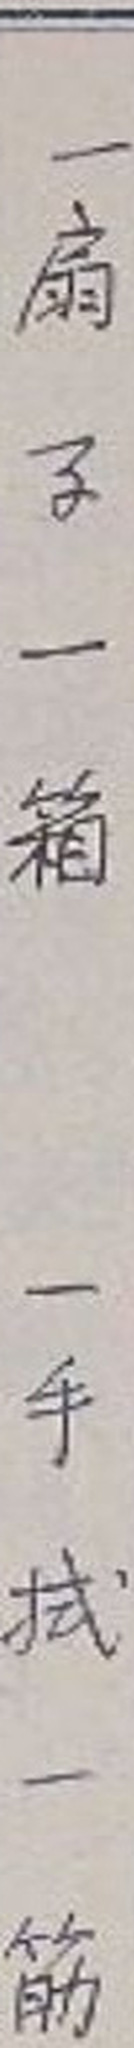一扇子一箱一手拭一筋
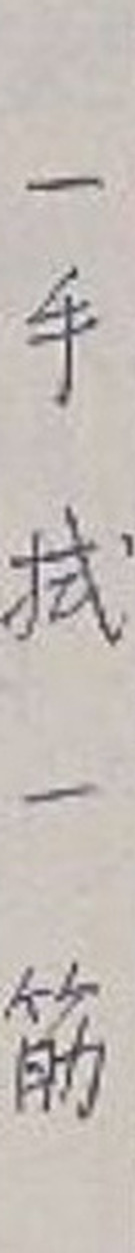一扇子一箱一手拭一筋
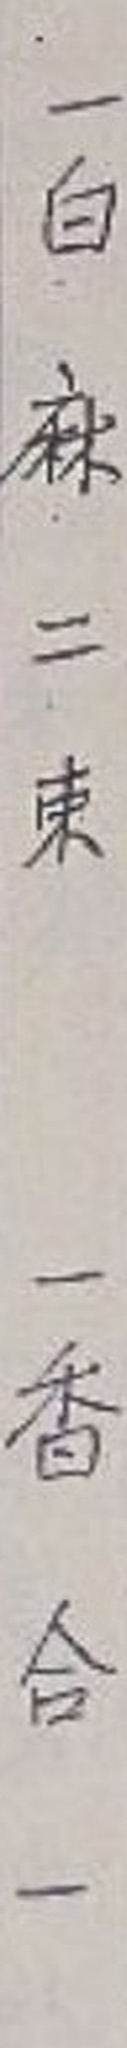一白麻二束一香合一
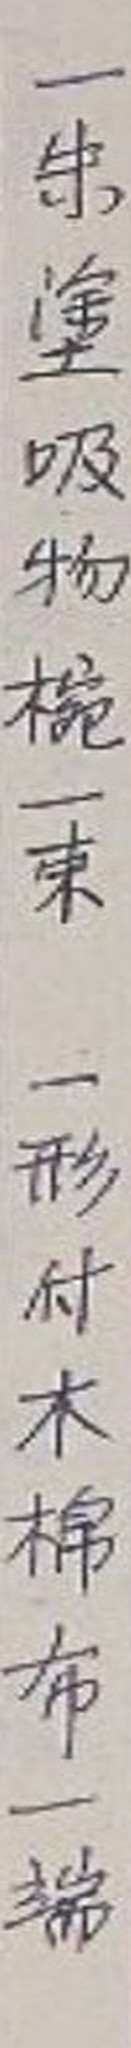一朱塗吸物椀一束一形付木棉布一端
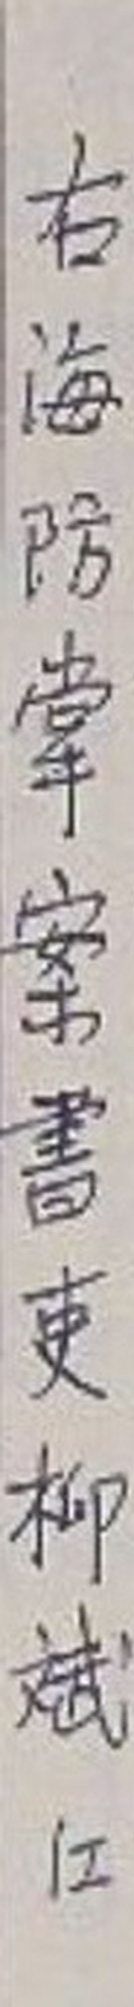右海防掌案書吏柳斌え
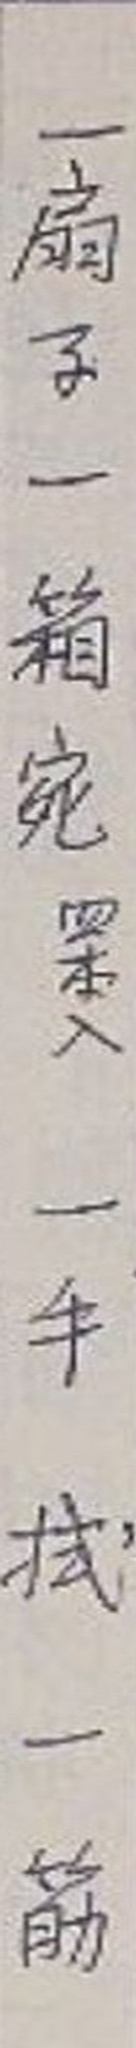一扇子一箱宛四本入一手拭一筋
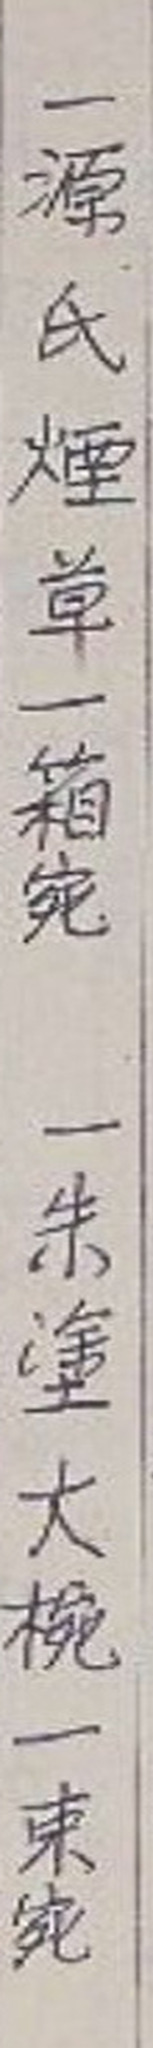一源氏煙草一箱宛一朱塗大椀一束宛
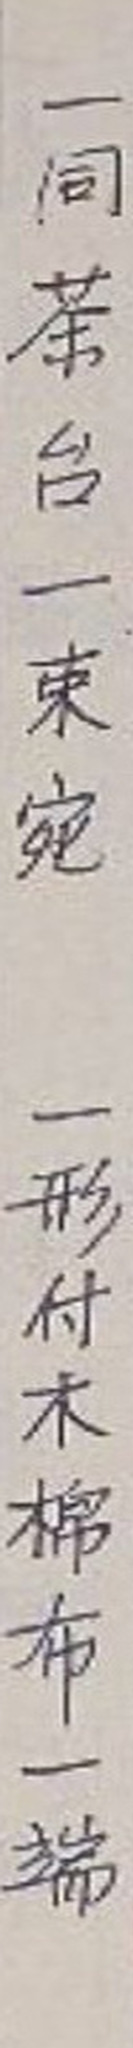一同茶台一束宛一形付木棉布一端
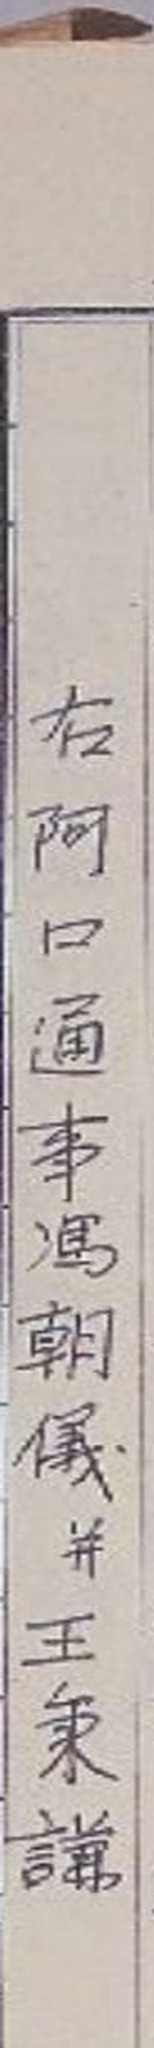右阿口通事馮朝儀并王秉謙
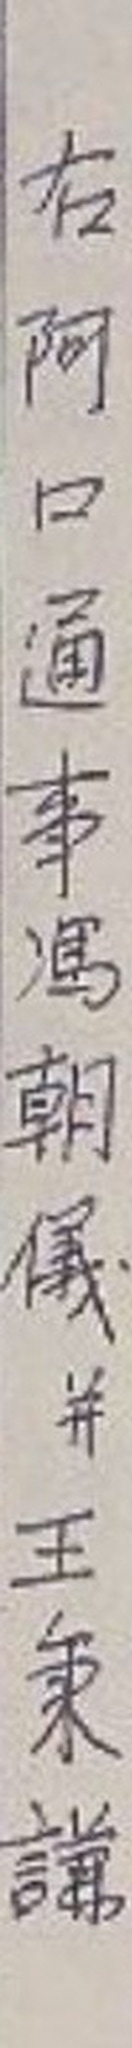右阿口通事馮朝儀并王秉謙
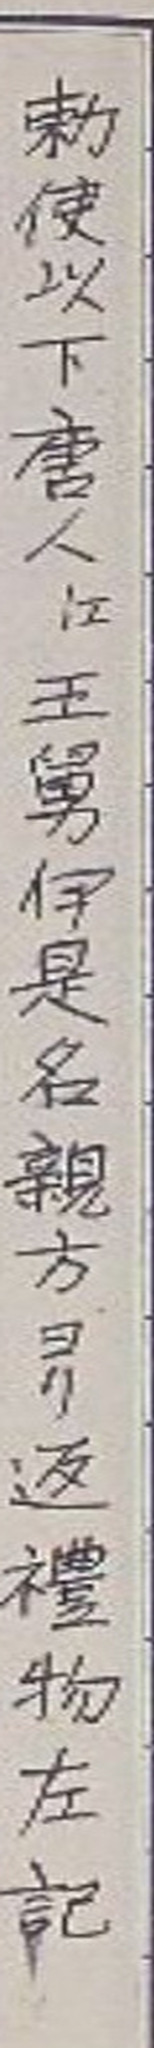勅使以下唐人え王舅伊是名親方より返礼物左記
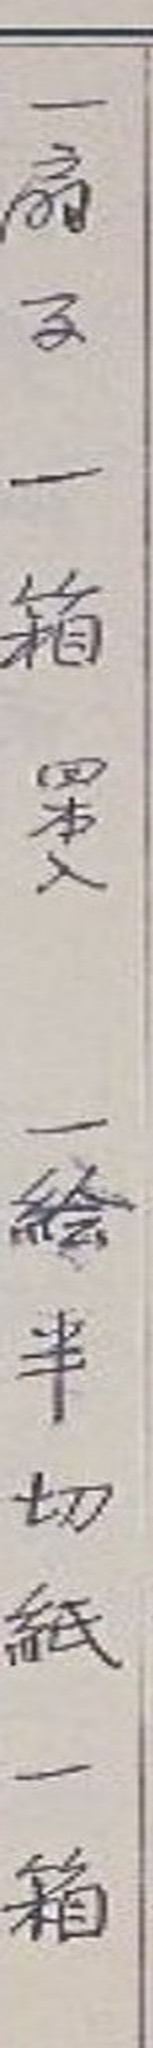一扇子一箱四本入一絵半切紙一箱
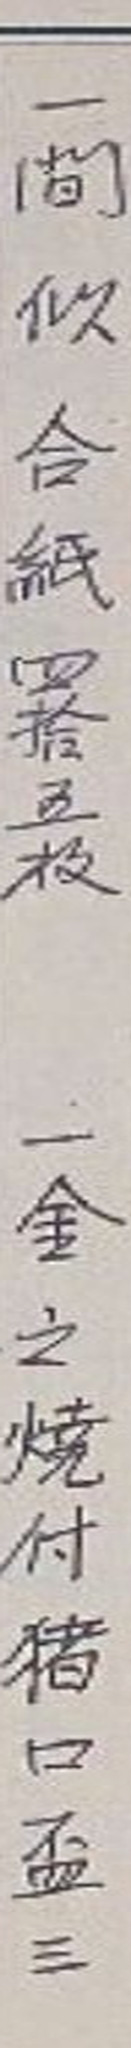一間似合紙四拾五枚一金之焼付猪口盃三
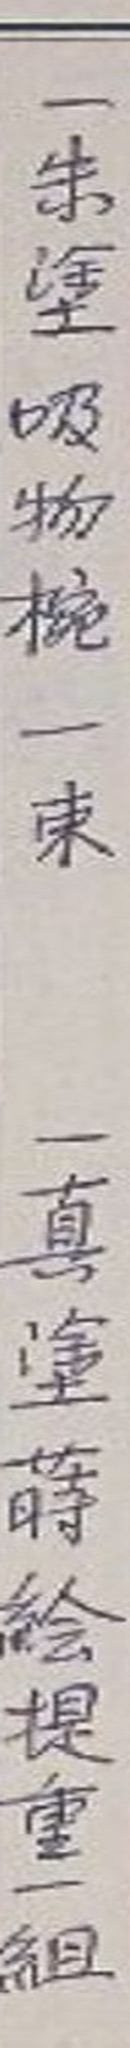一朱塗吸物椀一束一間塗蒔絵提重一組
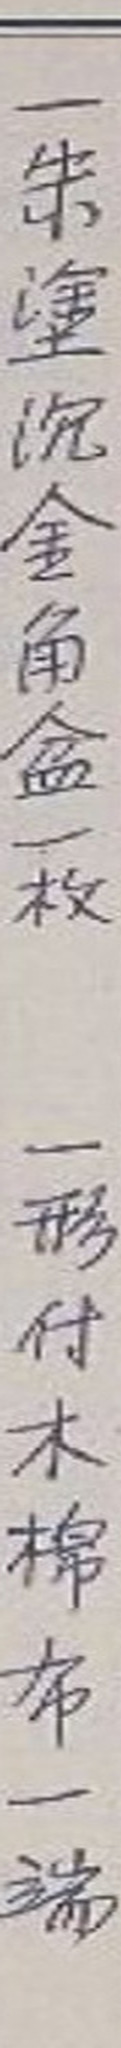一朱塗沈金角盆一枚一形付木棉布一端
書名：支那冊封使来琉諸記 下巻
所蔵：University of the Ryukyus Library
